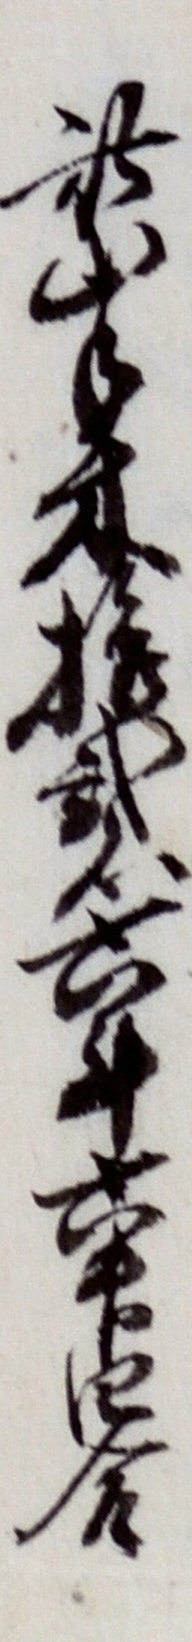此山手米拾弐石六斗六升四合
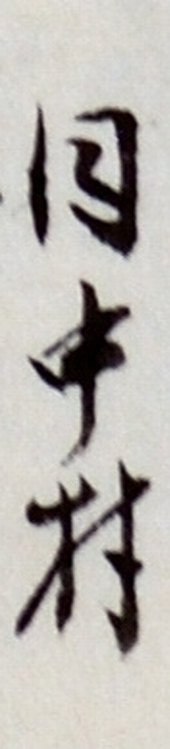田中村
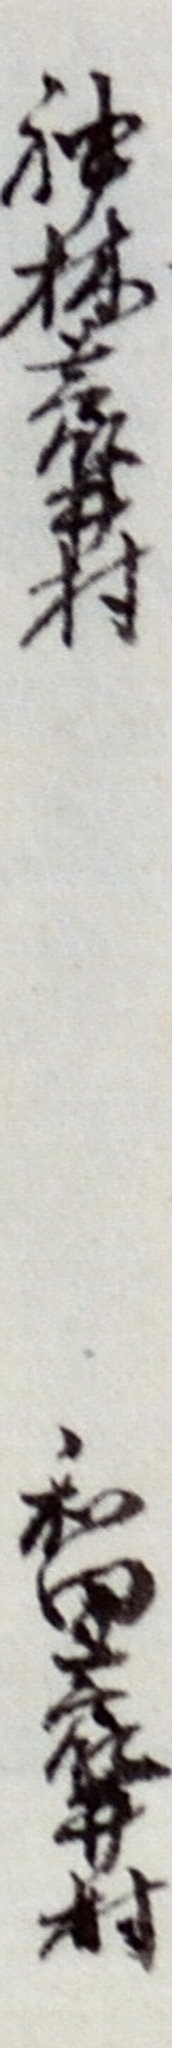神林荒井村和田荒井村
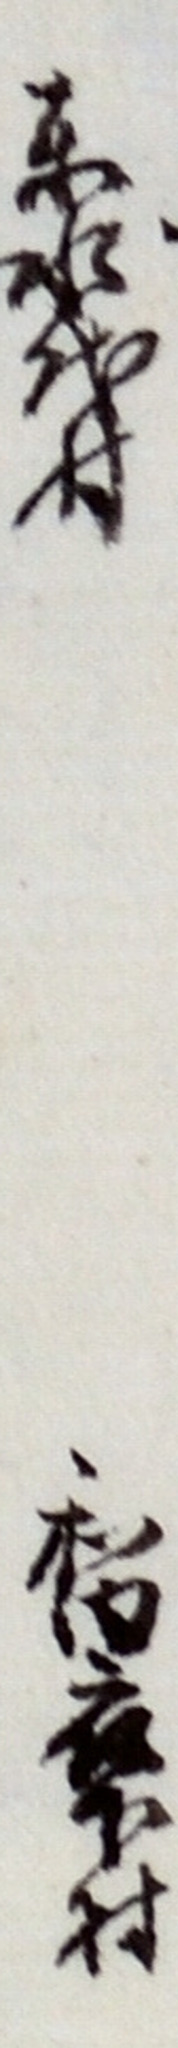東水代村和田衣下村
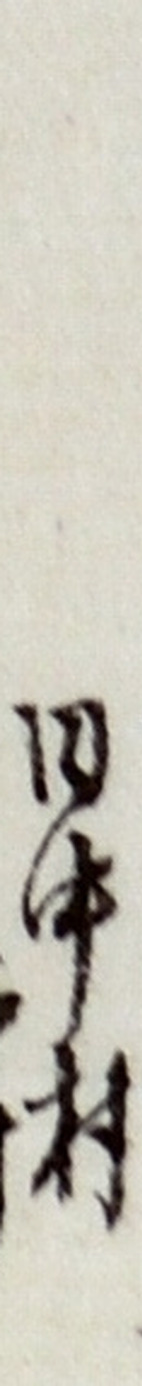田中村
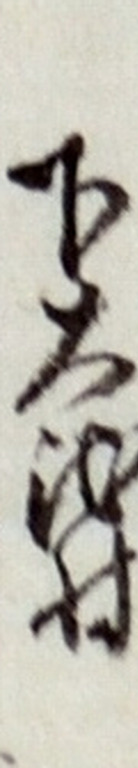上大池村
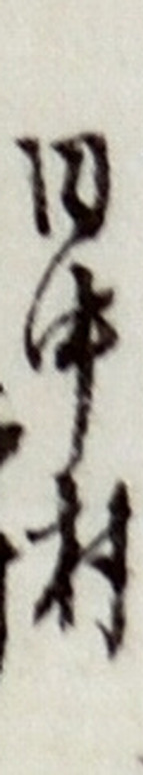田中村
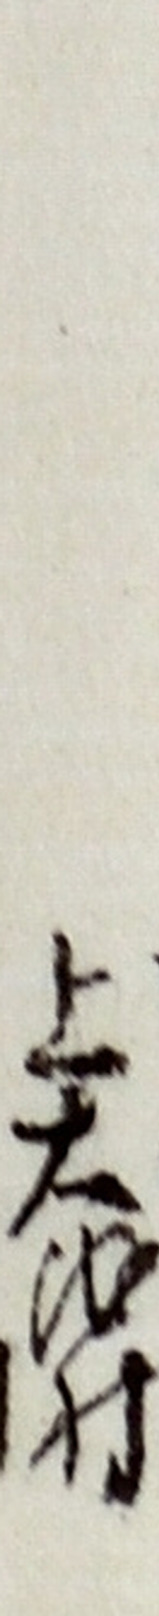上大池村
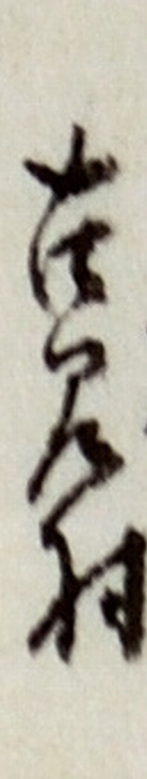古見村
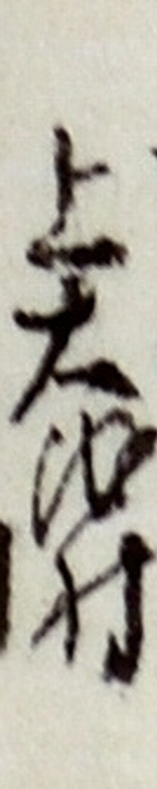上大池村
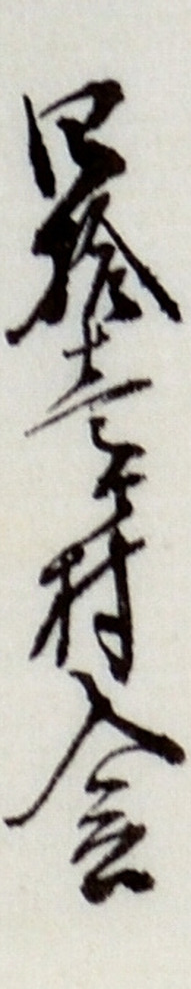四拾壱ヶ村入会
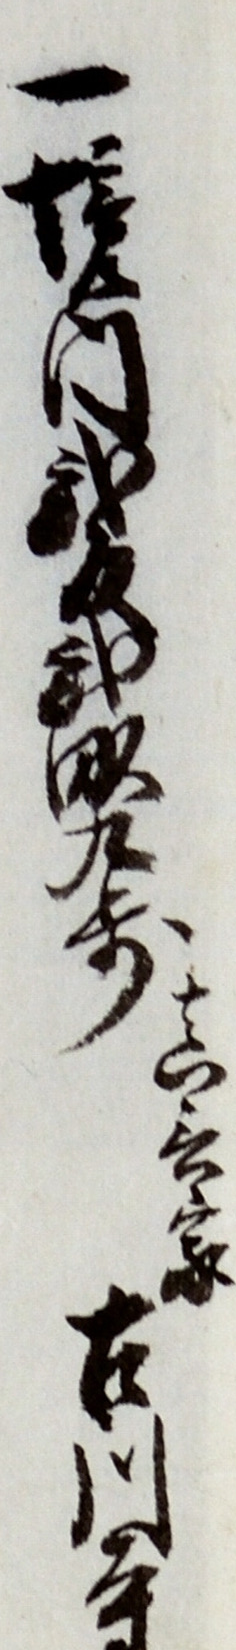一境内弐反弐畝九歩古川寺
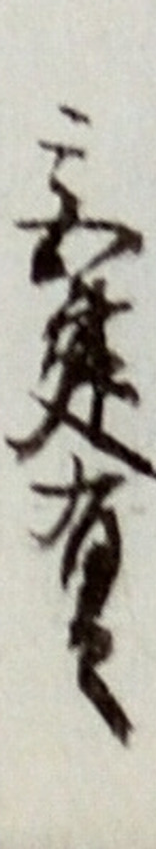宮建有之
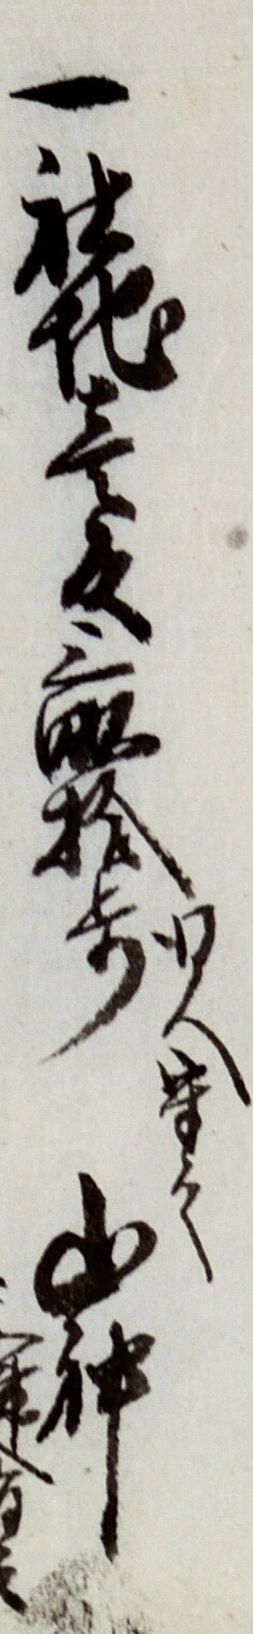一社地壱反三畝拾歩山神
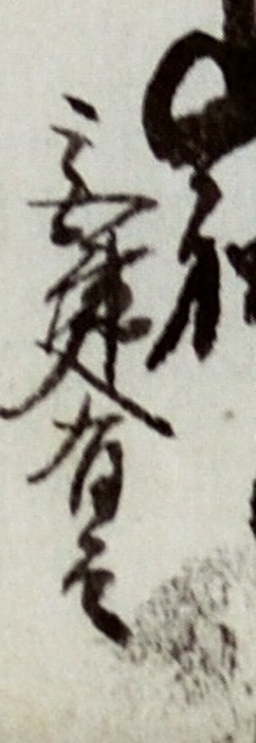宮建有之
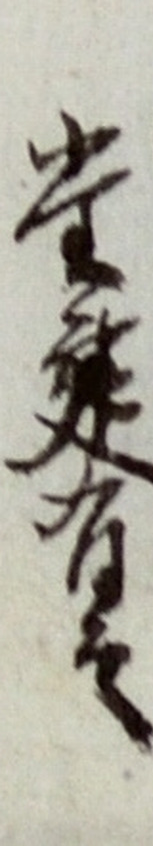堂建有之
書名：御領分中山林社地手控
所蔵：伊那市立高遠町図書館・合同会社AMANE
